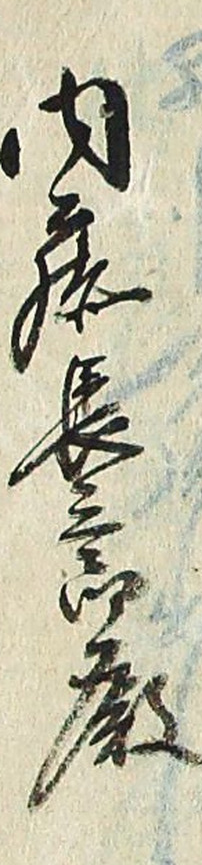内藤長三郎殿

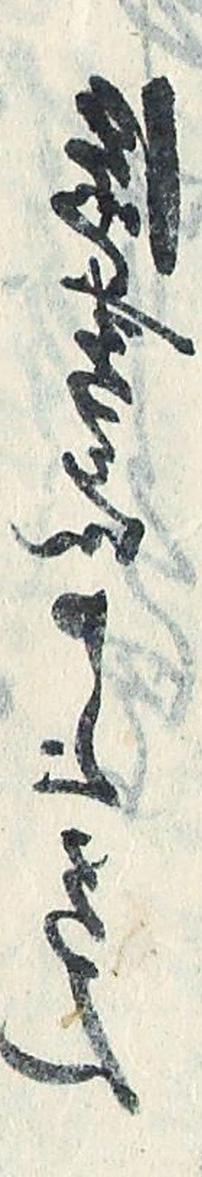午六月十一日
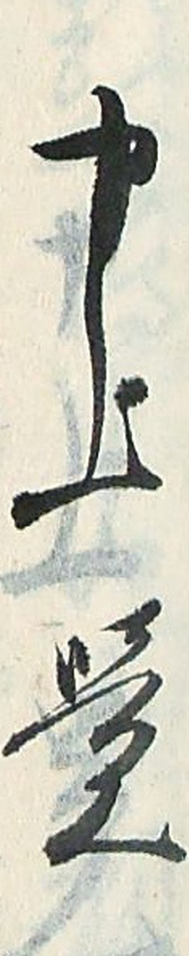申上覚
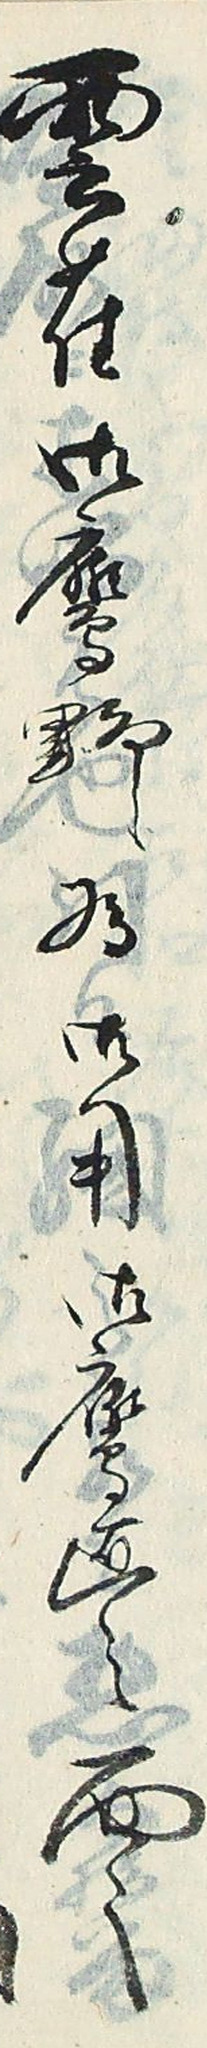雲雀御鷹野為御用御鷹匠之面々
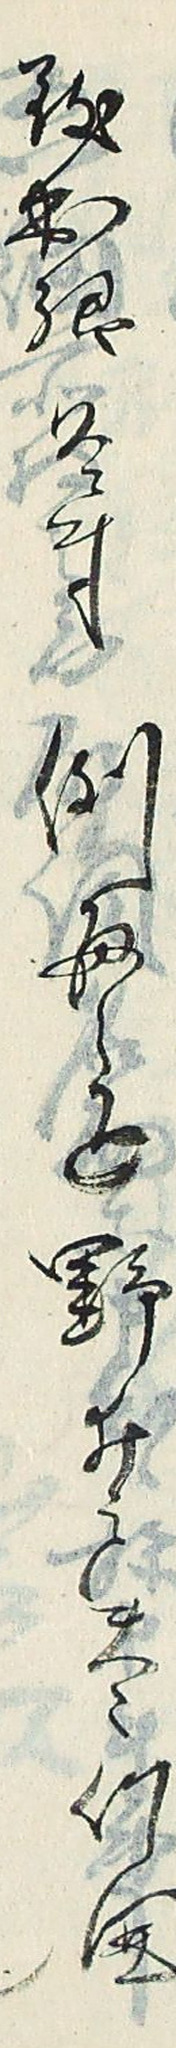致出郷候に付例毎之通野井戸夫々竹囲
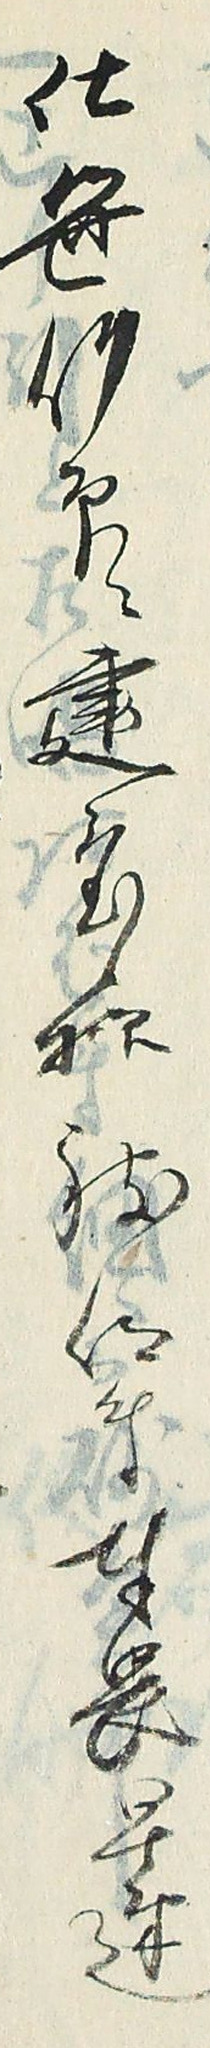仕笹竹印に建置候様被仰付奉畏早速
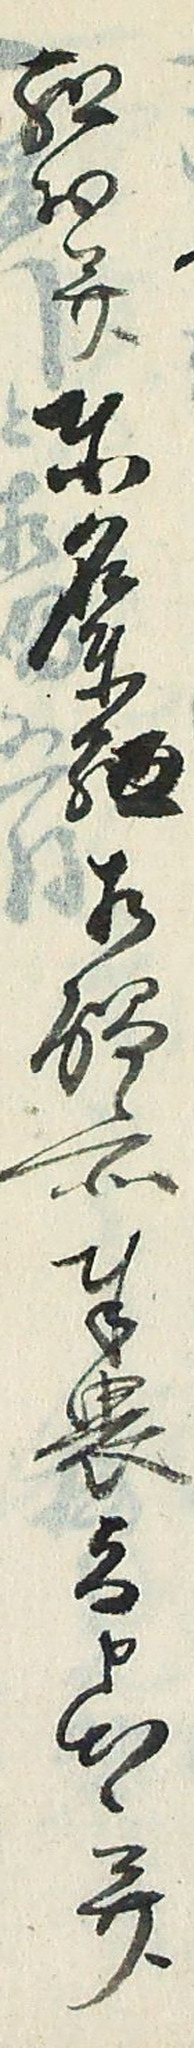組村幷東名東組相触候所奉畏旨申出候幷
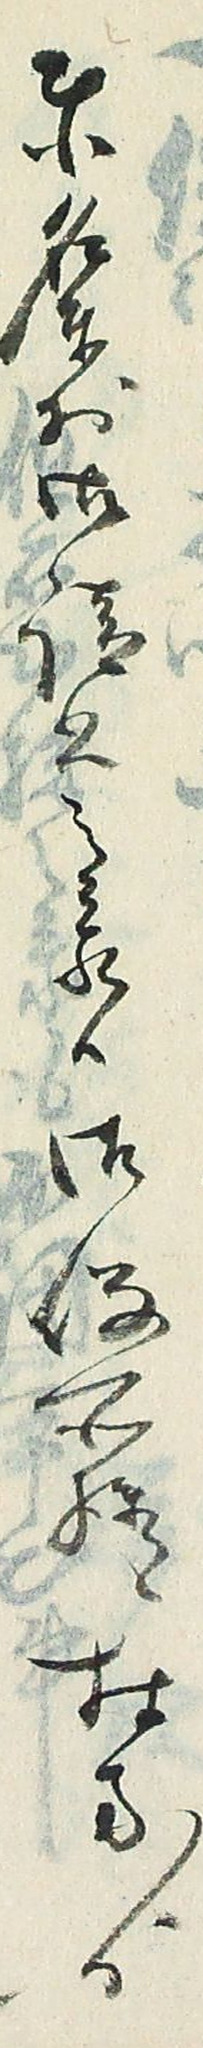東名東村御請書之儀は御役所様へ村方ゟ
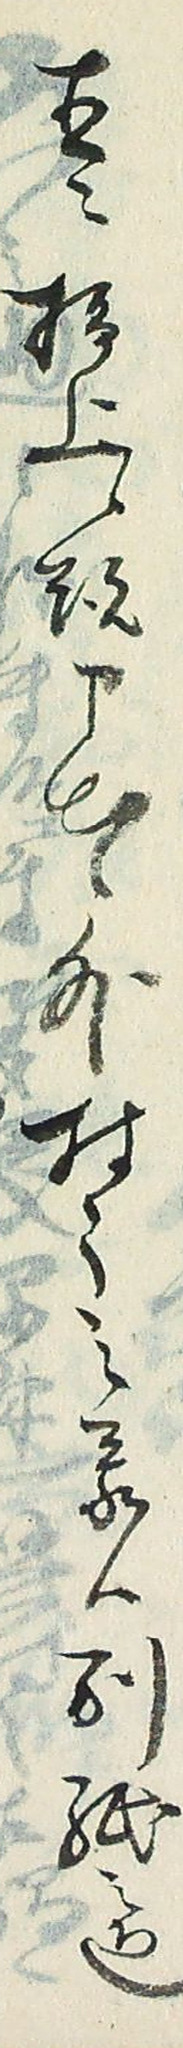直々指上候趣申出候外村々之義は別紙之通
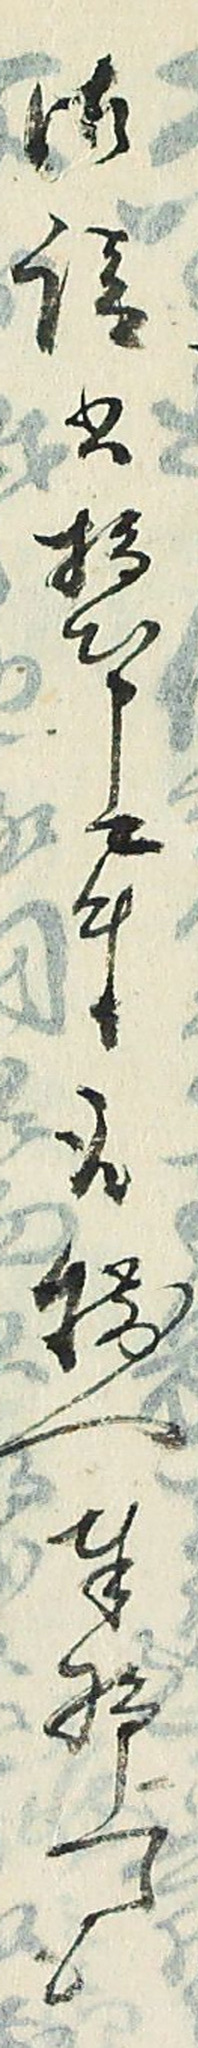御請書指出申に付取揃へ奉指上候以上
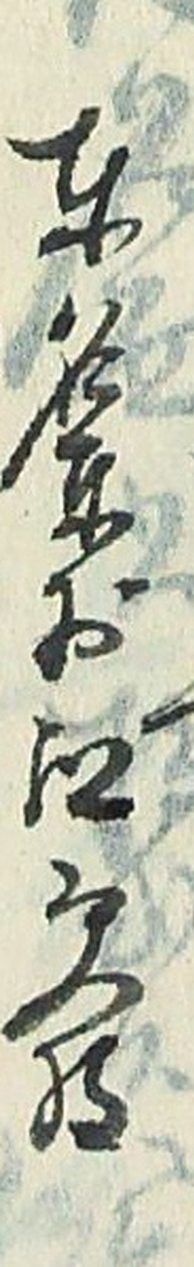東名東村組受持
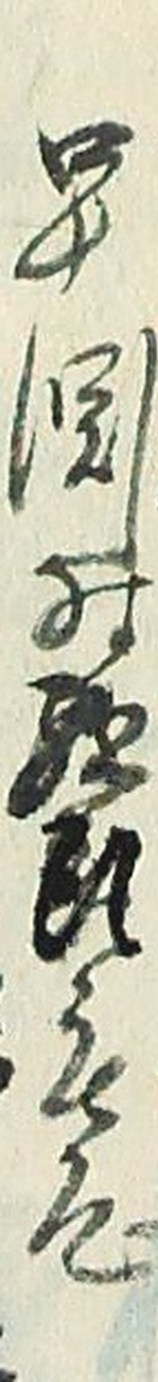早渕村組頭庄屋
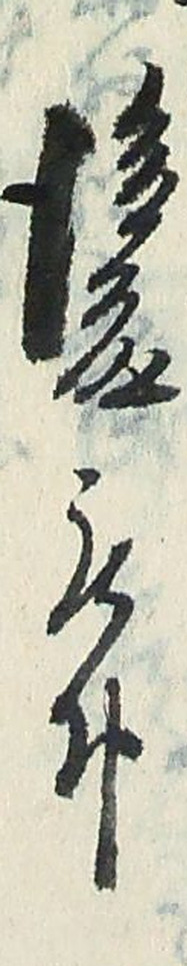後藤庄助
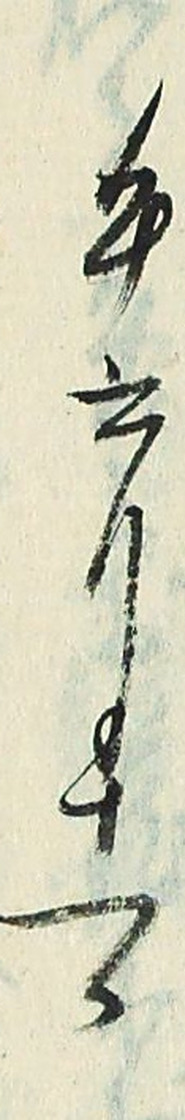午六月十一日
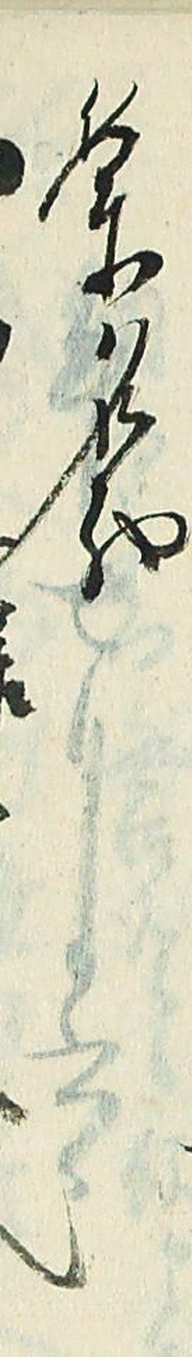名東名西
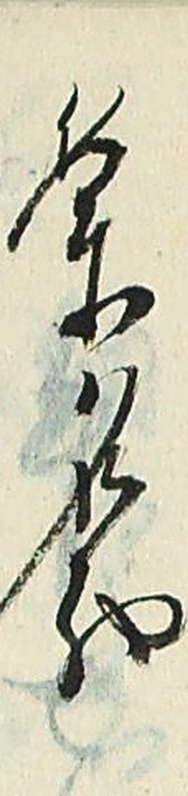名東名西
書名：諸御用御□受書控
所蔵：鳴門教育大学 Naruto University of Education
